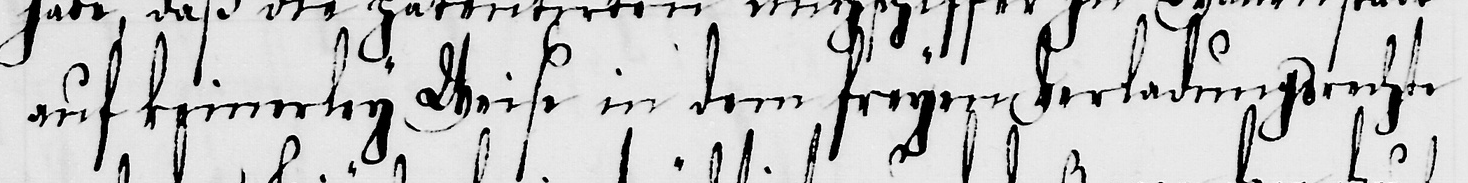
auf keinerley Weise in dem freyen Verladungsrechte
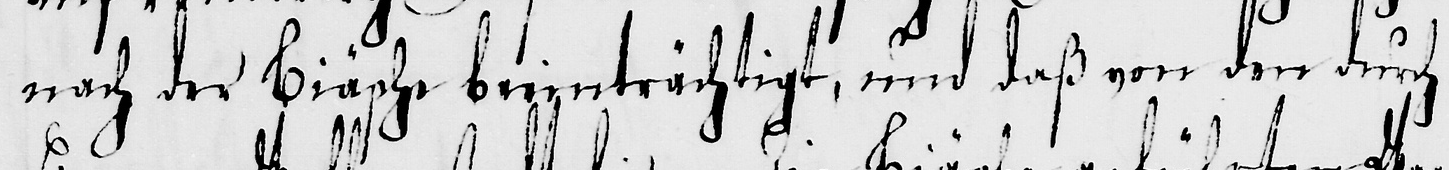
nach der Biäsche beeinträchtigt, und daß von den durch
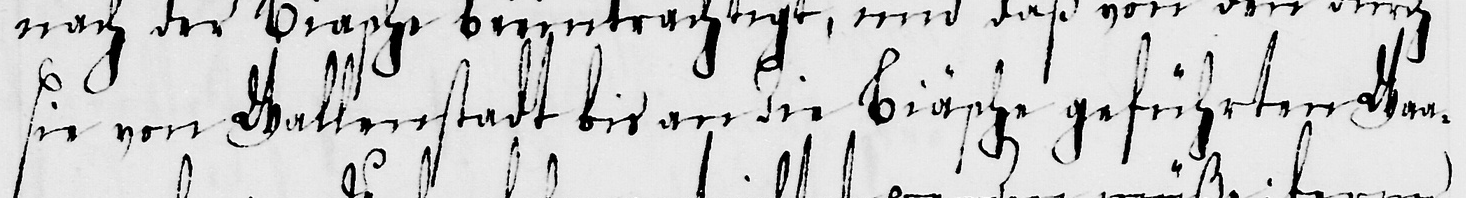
sie von Wallenstadt bis an die Biäsche geführten Wa¬
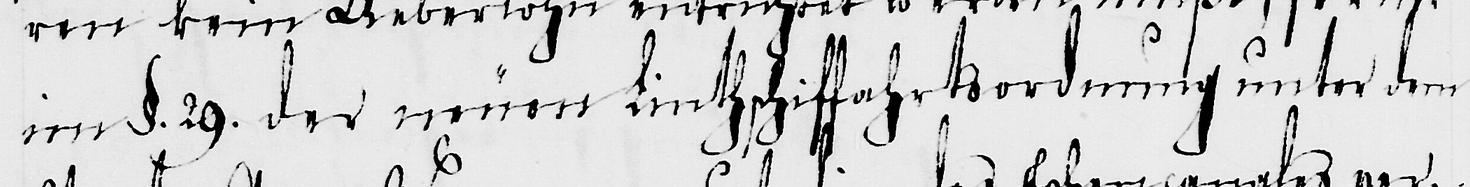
im §. 29. der neuen Linthschiffahrtsordnung unter dem
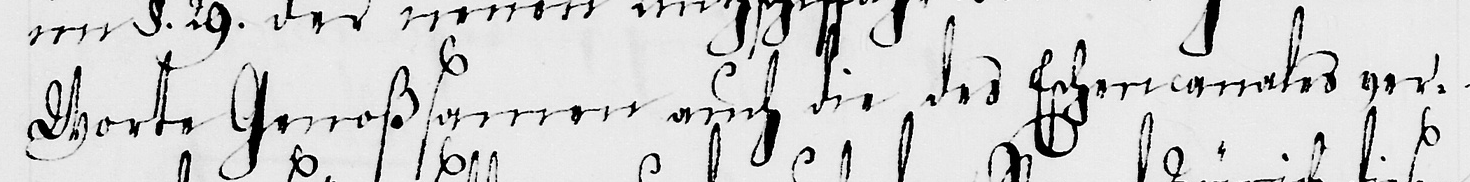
Worte Genoßsamen auch die des Eschencanales ver¬
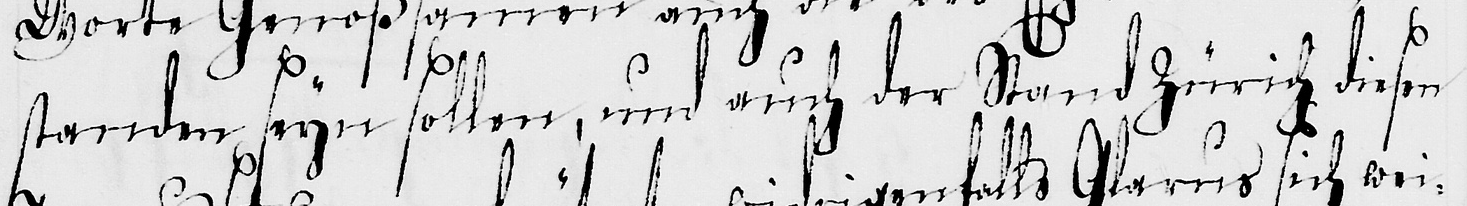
standen seyn sollen, und auch der Stand Zürich diesen
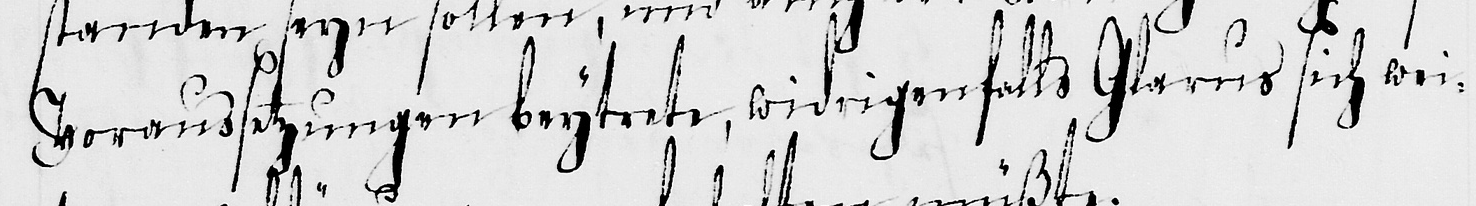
Voraussetzungen beytrete, widrigenfalls Glarus sich wei¬
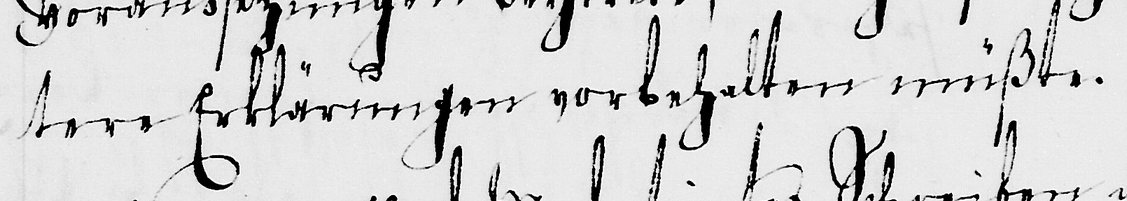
tere Erklärungen vorbehalten müßte.
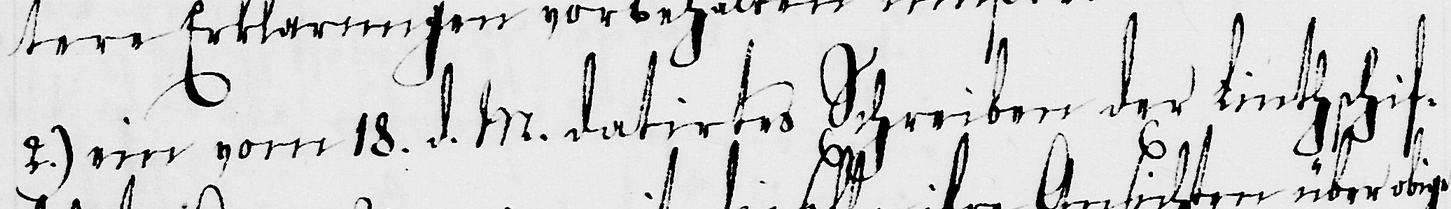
2.) ein vom 18. d. M. datirtes Schreiben der Linthschif¬
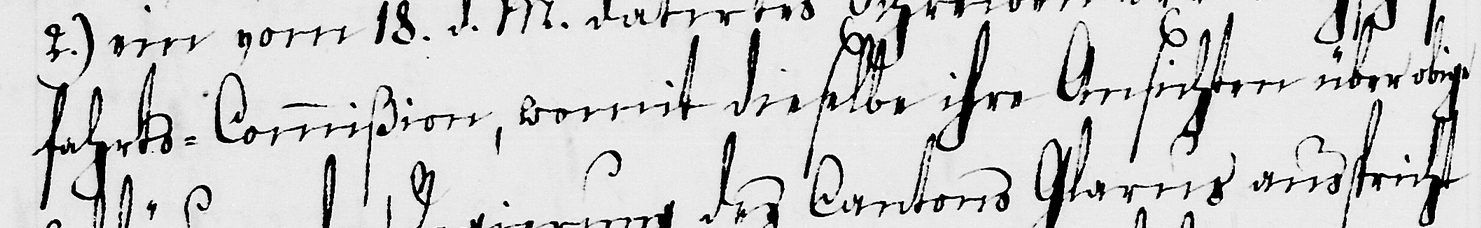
fahrts-Commißion, womit dieselbe ihre Ansichten über ob¬
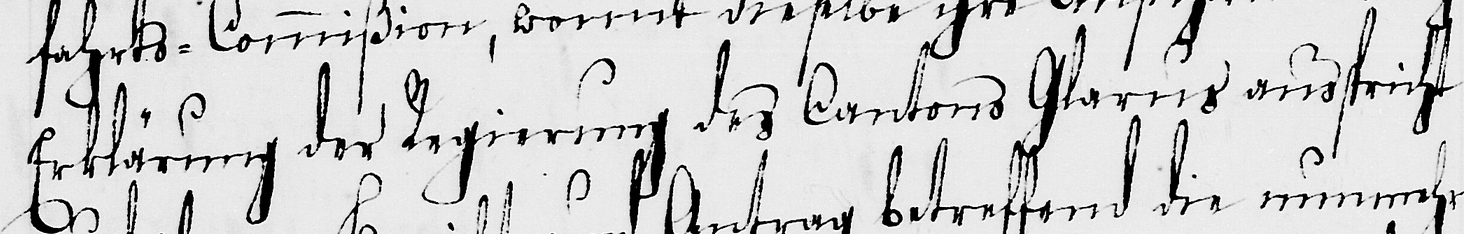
Erklärung der Regierung des Cantons Glarus ausspricht
